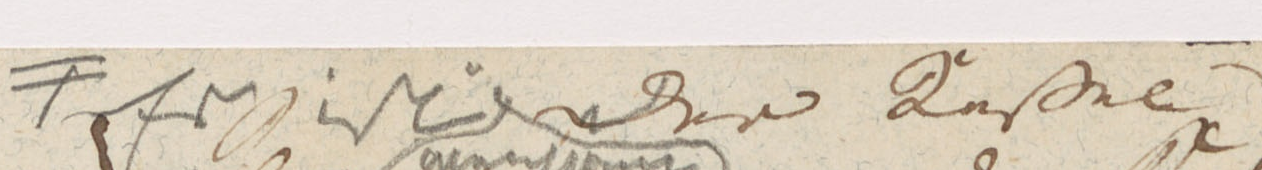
% Es ist gleichsam Dder Kessel
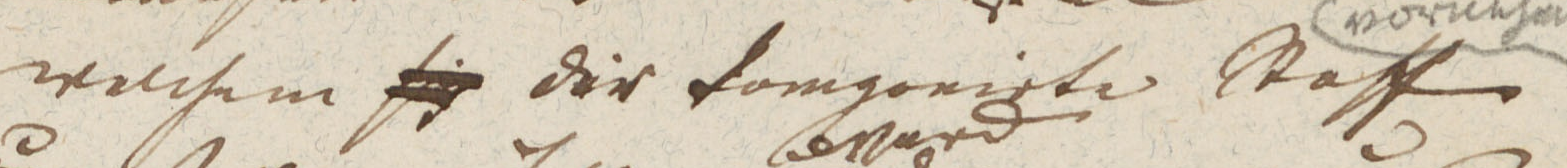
welchem sich dieer komponirte Stoff
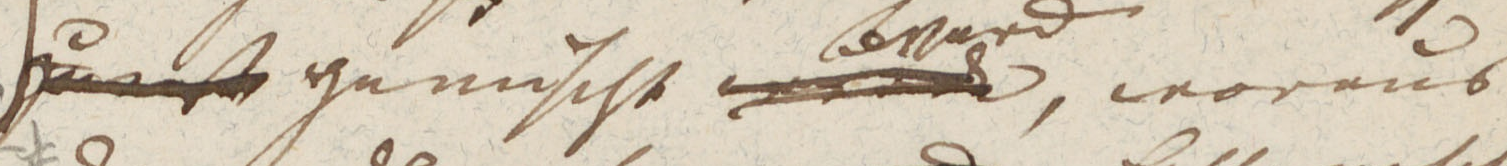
zuerst gemischt wurde ward, woraus
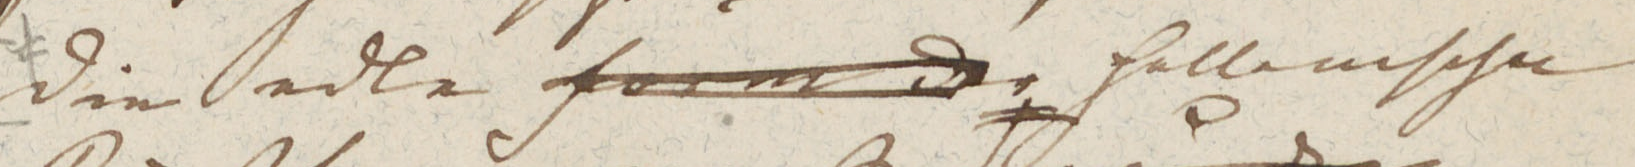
die edle Form der Hellenische
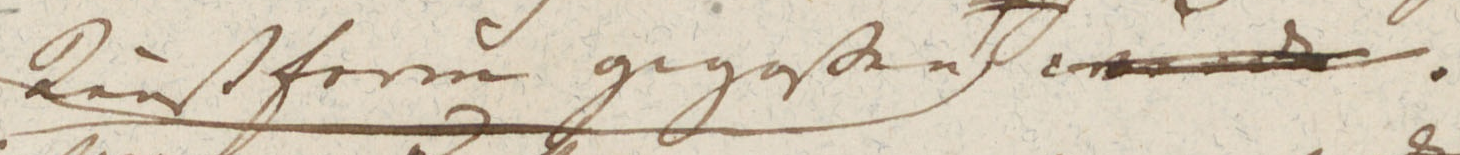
Kunstform gegossen % wurde.
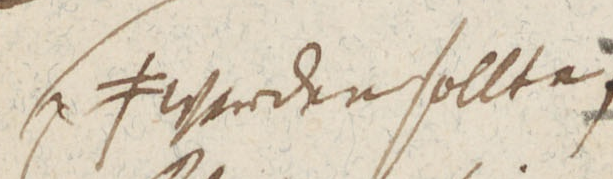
% werden sollte,. %
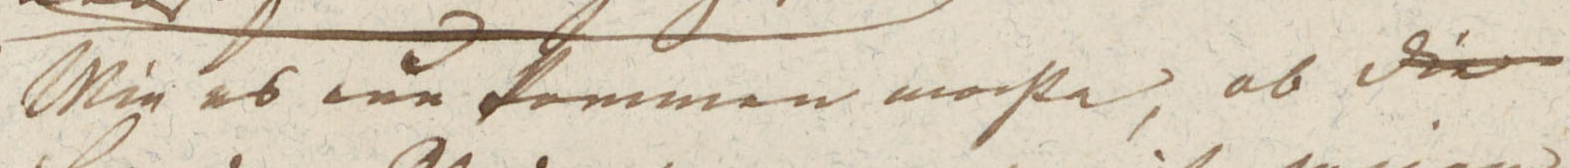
Wie es nun kommen mochte, ob die
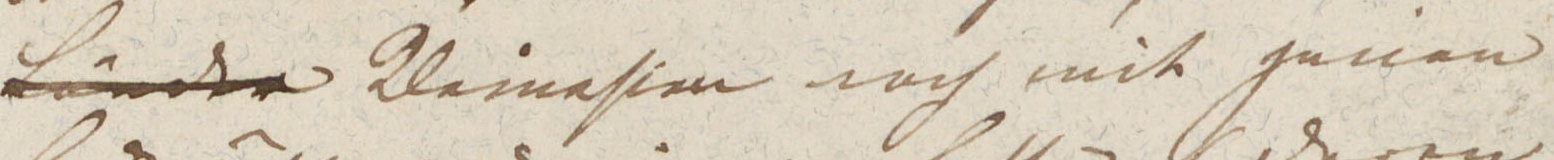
Länder Kleinasien noch mit jenen
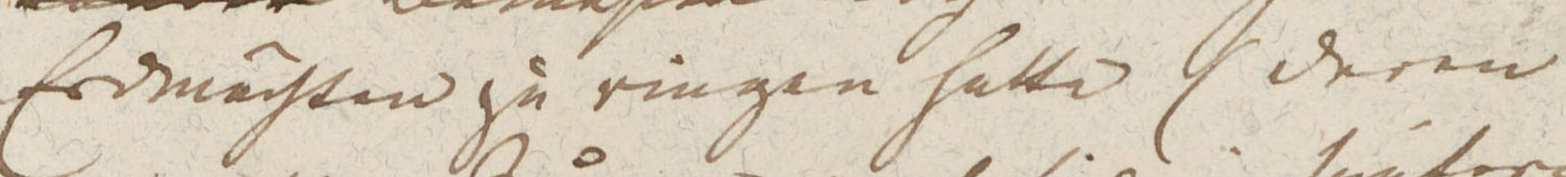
Erdmächten zu ringen hatte (deren
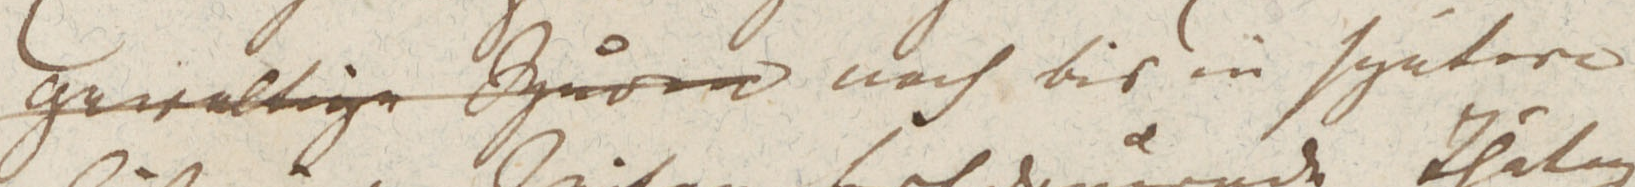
gewaltige Spuren noch bis in spätere
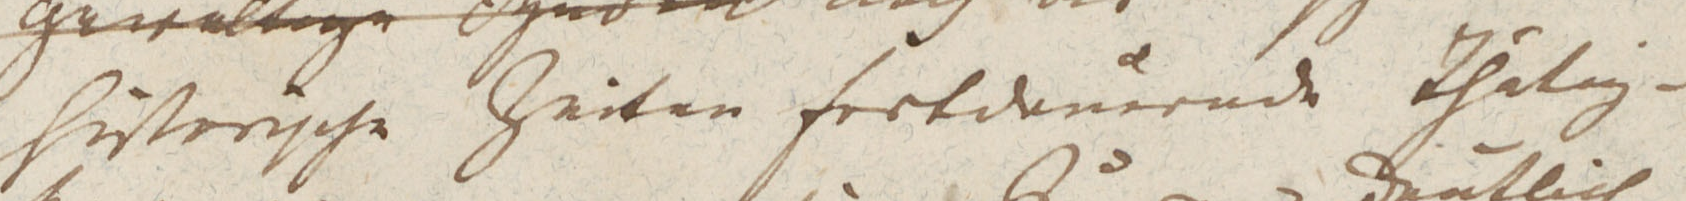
historische Zeiten fortdauernde Thätig-
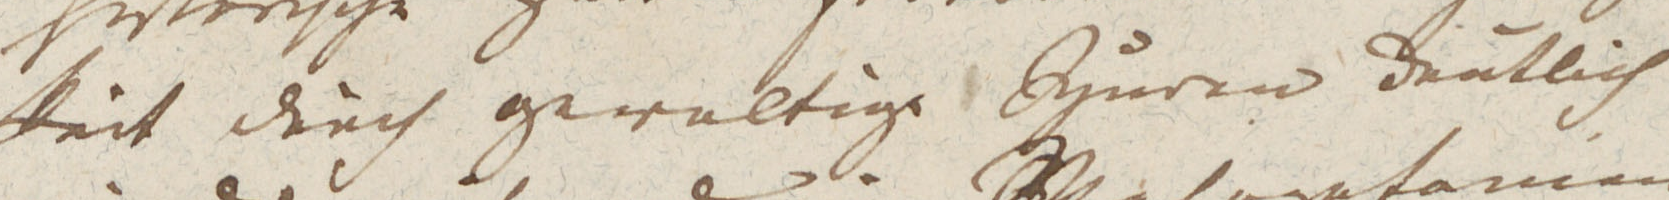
keit durch gewaltige Spuren deutlich
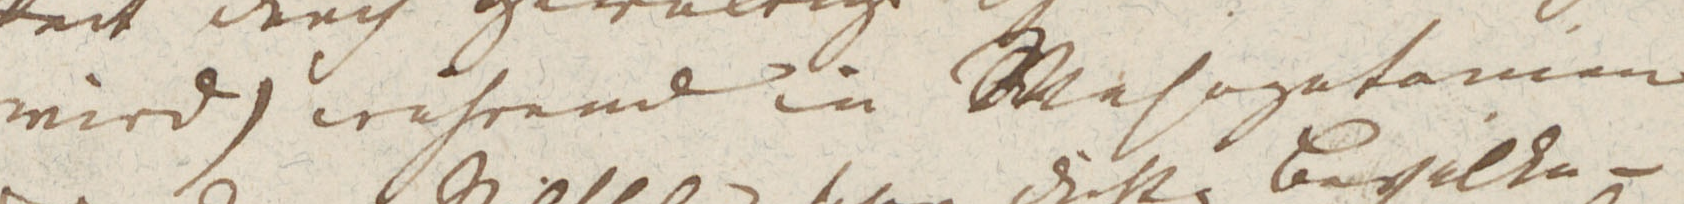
wird) während in SMesopotamien
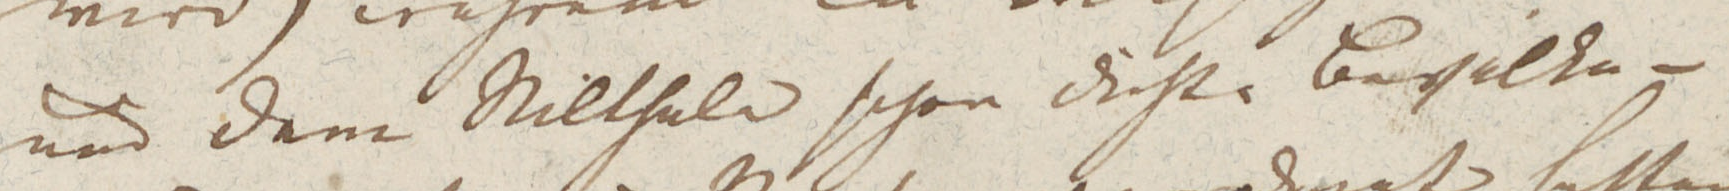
und dem Nilthale schon dichte Bevölke-
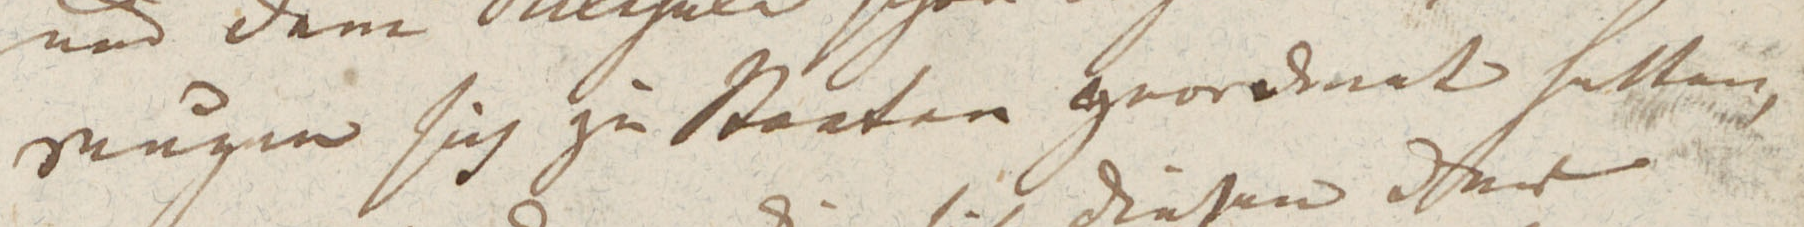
rungen sich zu Staaten geordnet hatten,
